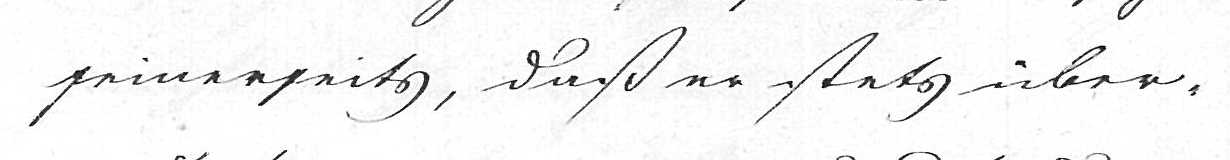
seinerseits, daß er stets über-
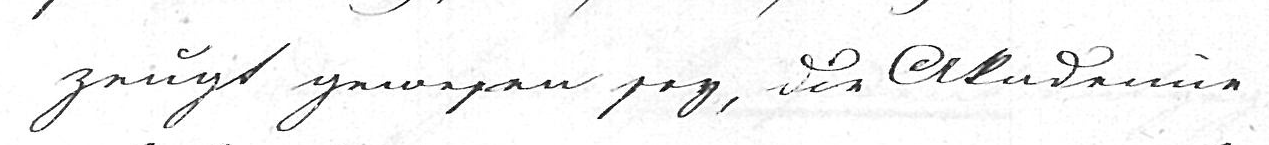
zeugt gewesen sey, die Akademie
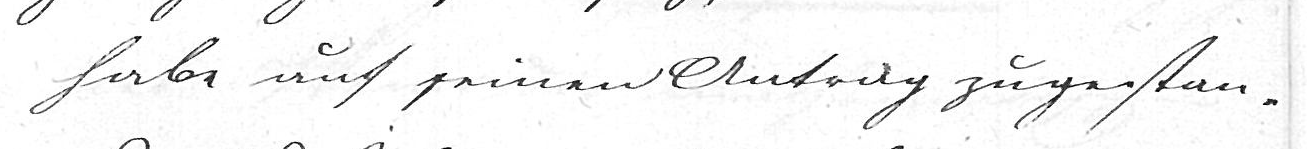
habe auf seinen Antrag zugestan-
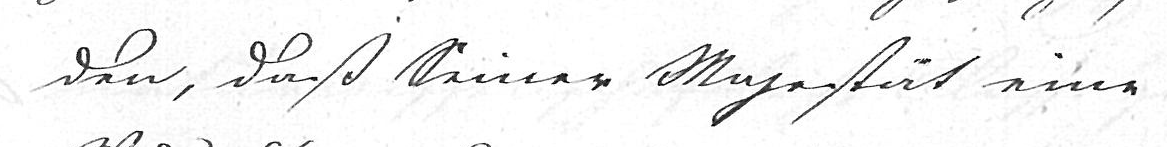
den, daß Seiner Majestät eine
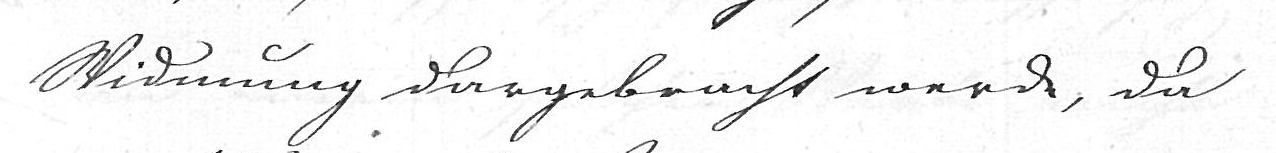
Widmung dargebracht werde, da
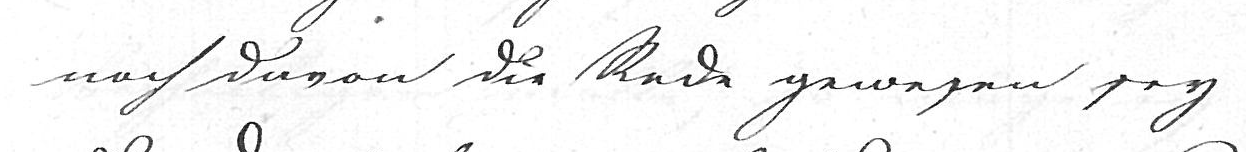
noch davon die Rede gewesen sey,
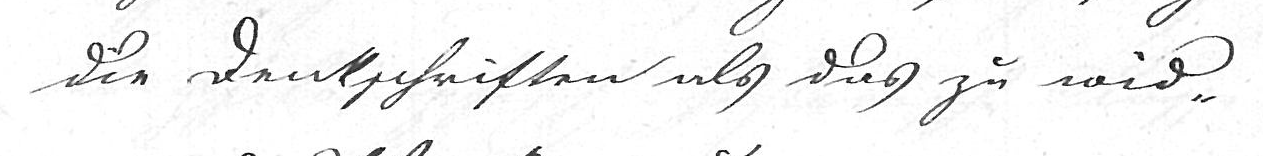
die Denkschriften als das zu wid-
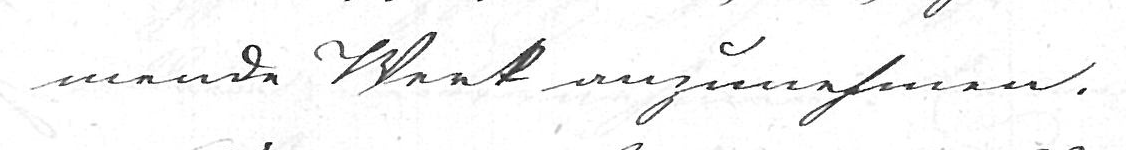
menden Werk anzunehmen.
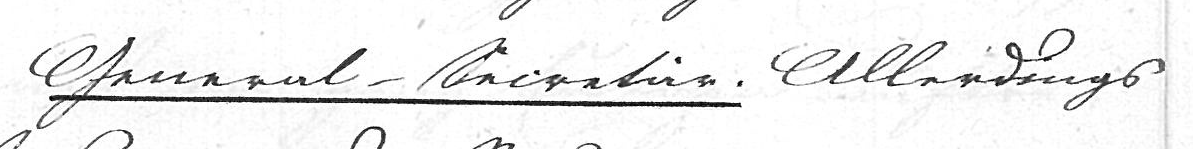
General-Secretär: Allerdings
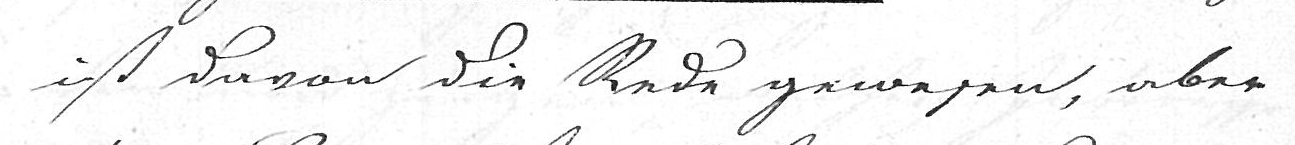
ist davon die Rede gewesen, aber
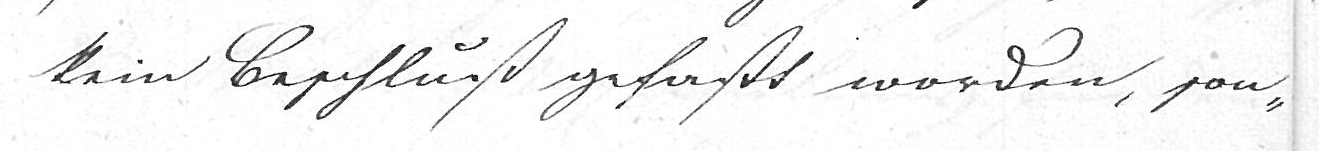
kein Beschluß gefaßt worden, son-
